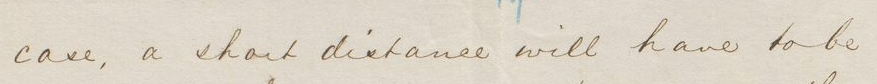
case, a short distance will have to be
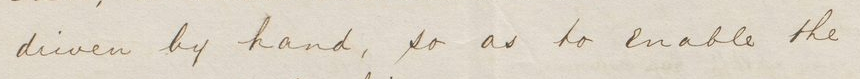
driven by hand, so as to enable the
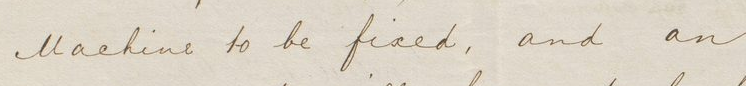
Machine to be fixed, and an
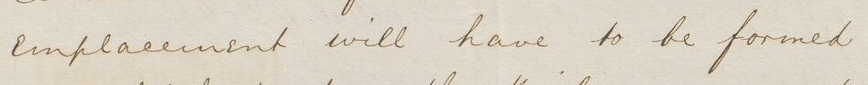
emplacement will have to be formed
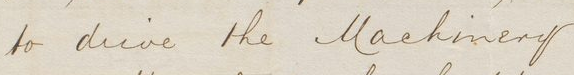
to drive the Machinery.
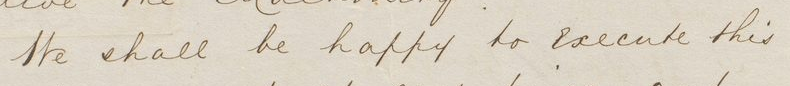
We shall be happy to execute this
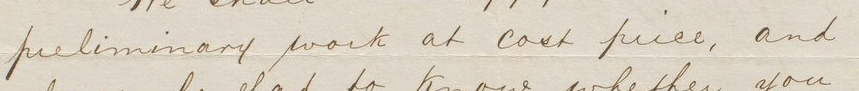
preliminary work at cost price, and
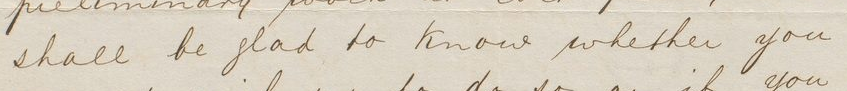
shall be glad to know whether you
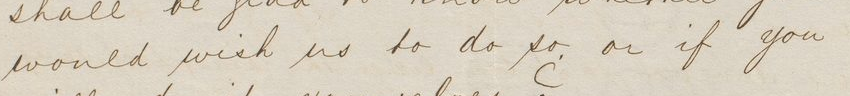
would wish us to do so, or if you
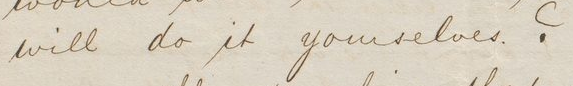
will do it yourselves.?
